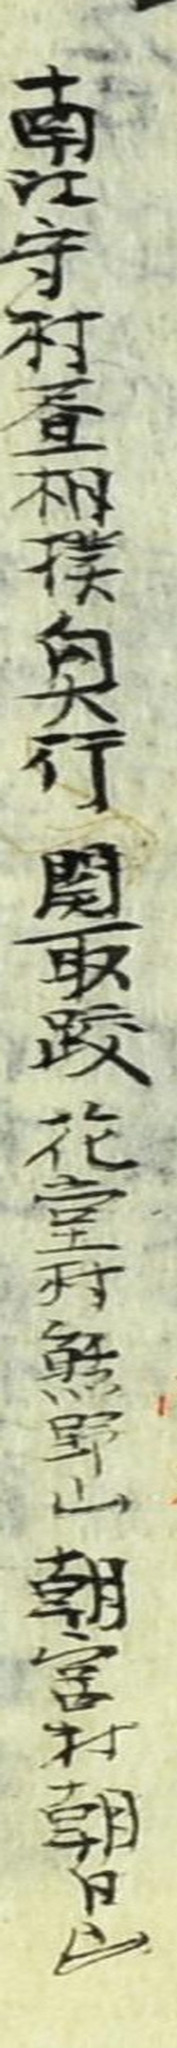南江守村昼相撲興行関取跤花堂村熊野山朝宮村朝日山
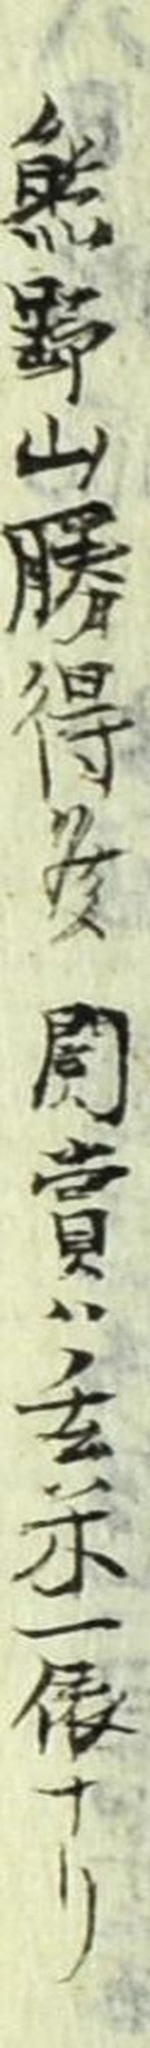熊野山勝得候関賞ハ玄米一俵ナリ
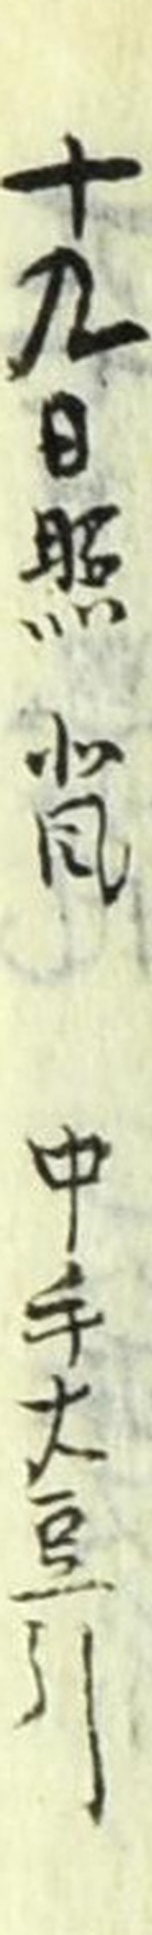十九日照北風中手大豆引

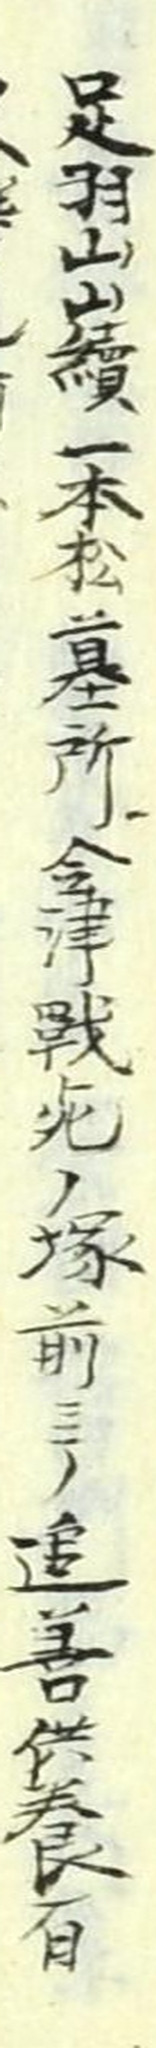足羽山山続一本松墓所会津戦死ノ塚前ニテ追善供養有
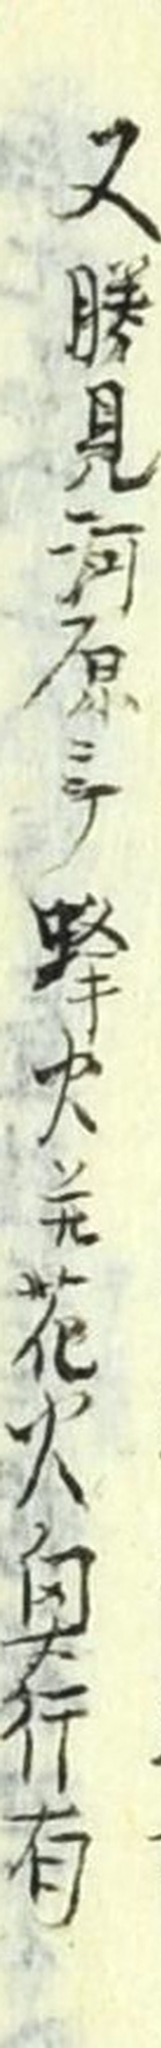又勝見河原ニテ蜂火幷花火興行有
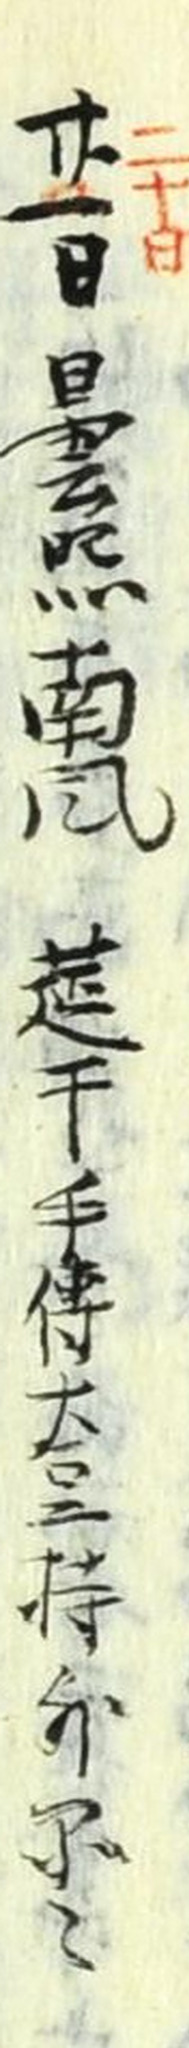廿○一日曇照南風莚干手伝大豆持外品々
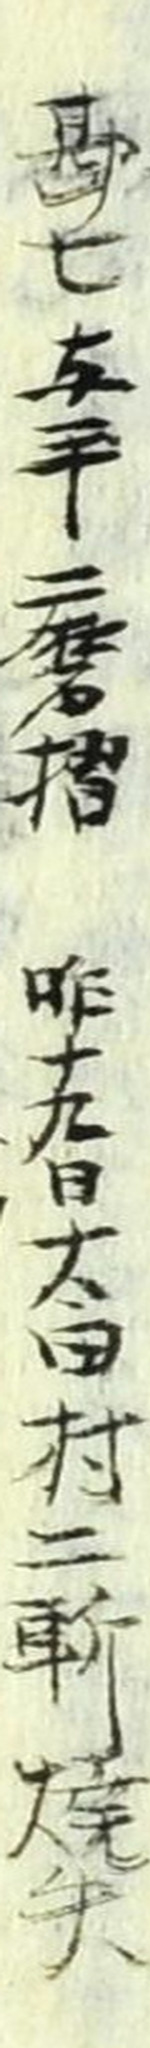勘七与平磨摺昨十九日太田村二斬焼失
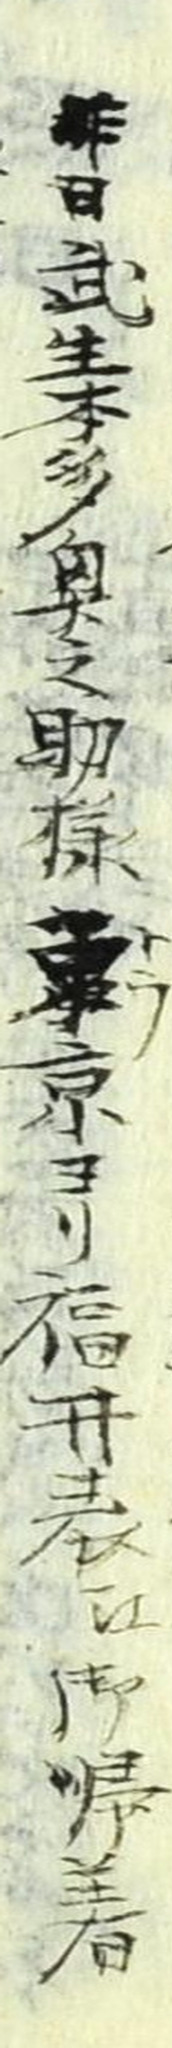昨夜武生本多興之助様東京より福井表江御帰着
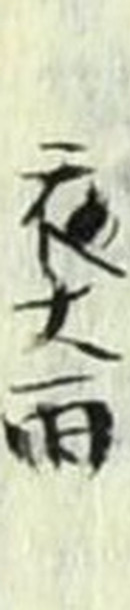夜大雨
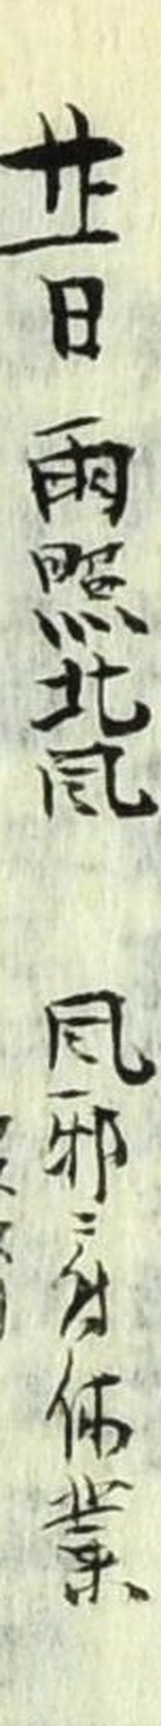廿一日雨照北風風邪ニ付休業
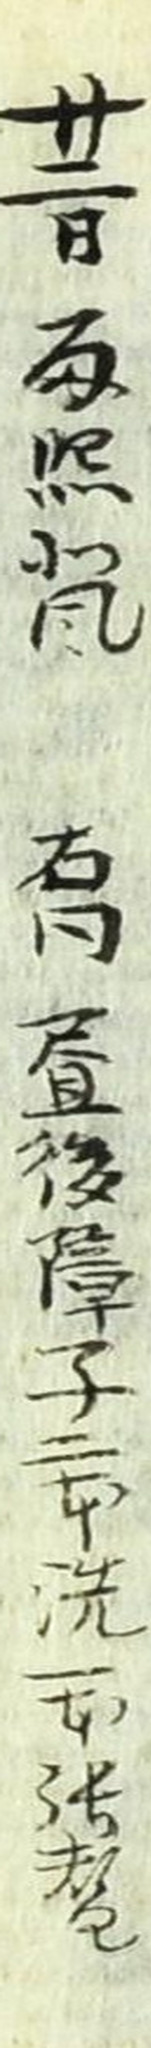廿二日雨照北風右同昼後障子二本洗一本張替
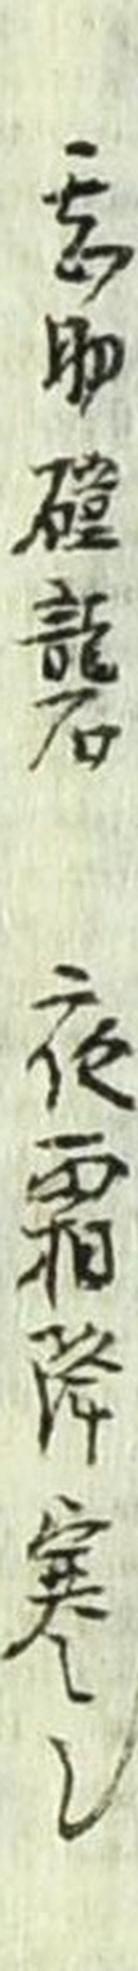甚助磑礱夜霜降寒シ
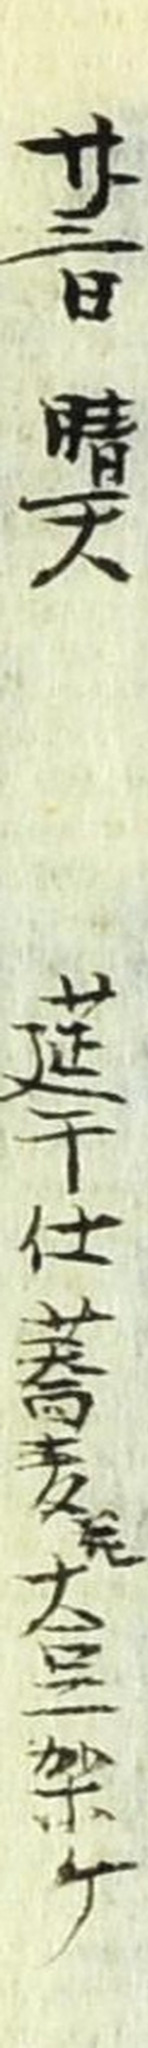廿三日晴天莚干蕎麦幷大豆架ケ
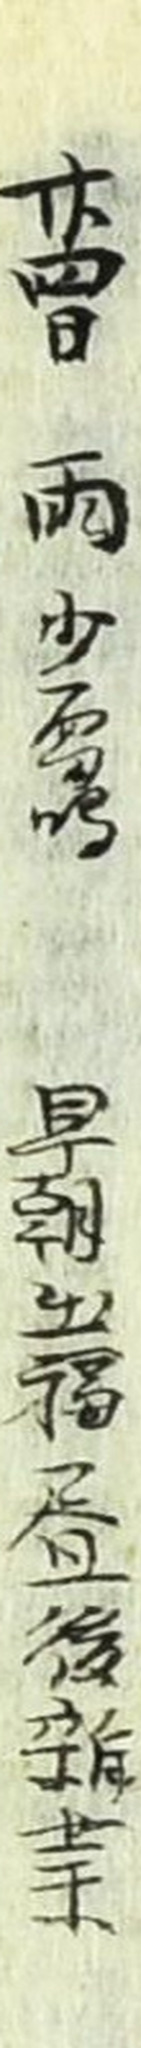廿四日雨少雷鳴朝出福昼後雑業
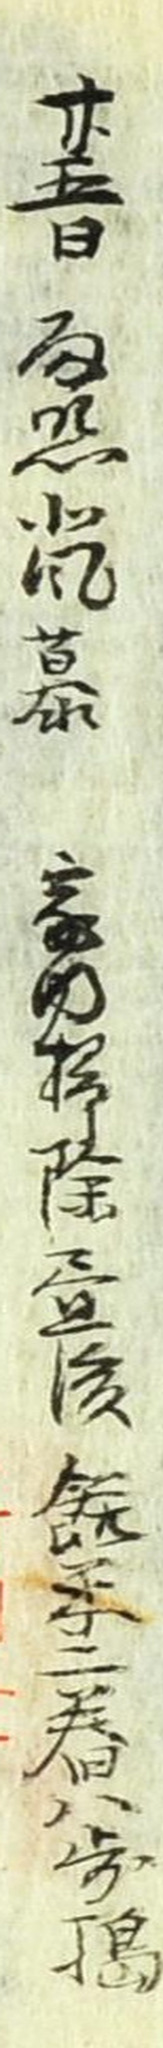廿五日雨照北風暴家内掃除昼後餅米㫪八歩搗
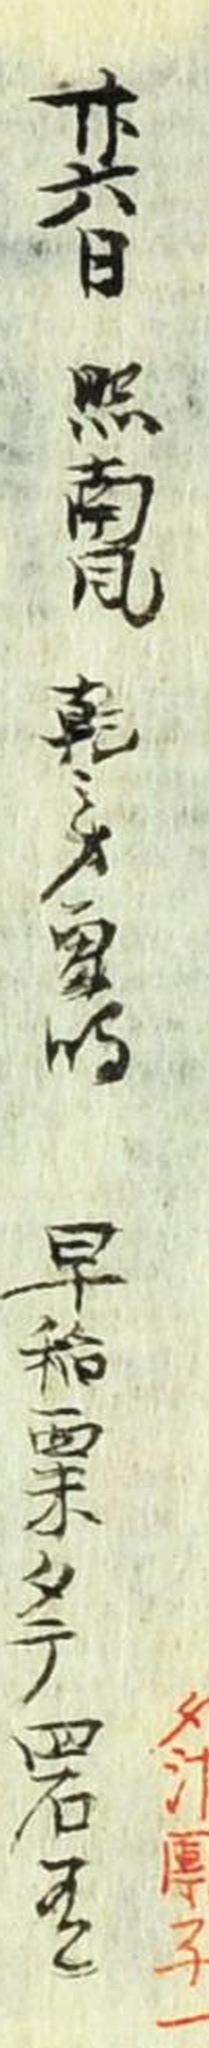廿六日照南風乾之方雷鳴早稲粟たて四石有
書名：（日記）
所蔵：福井県文書館 Fukui Prefectural Archives
